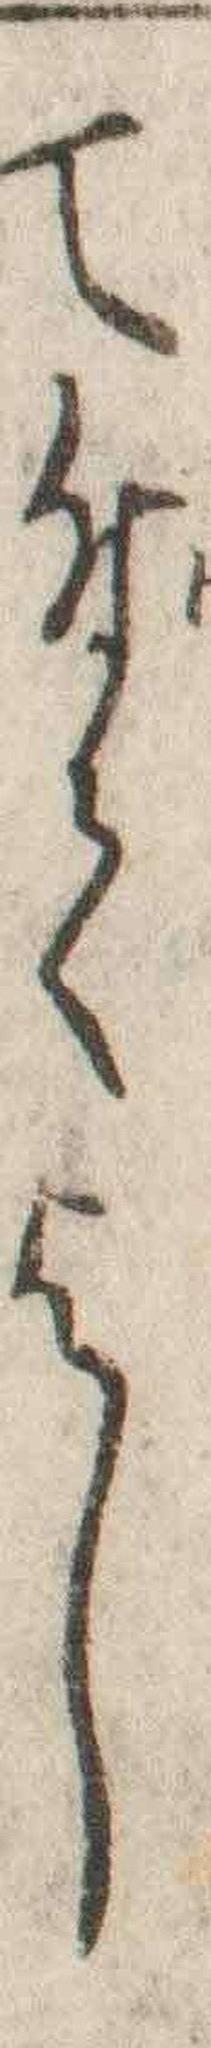て付てよし
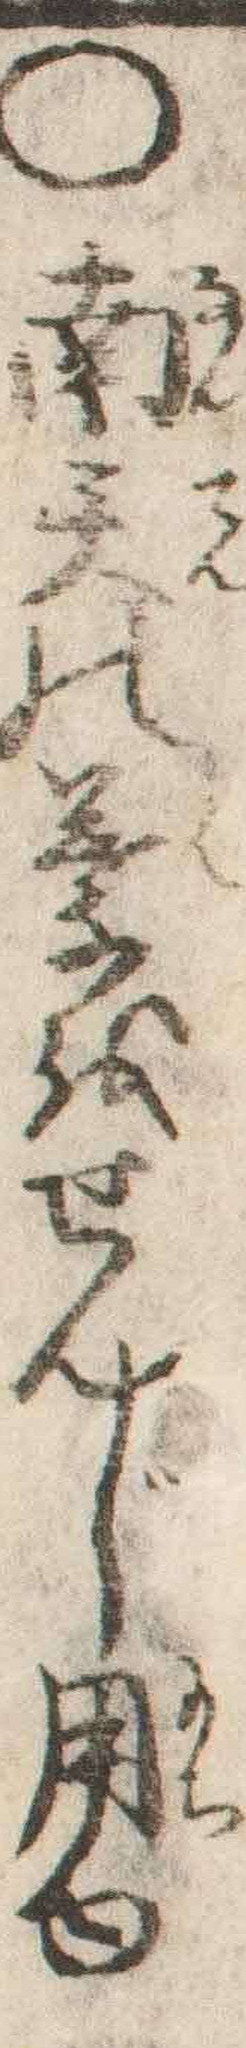○南天の葉をせんじ用ゆ
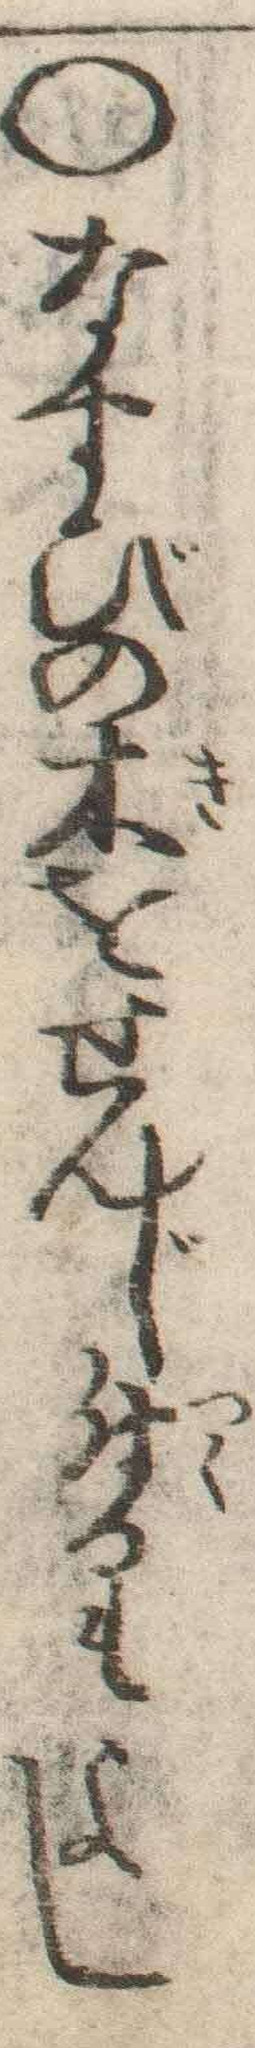○なすびの木をせんじ付るもよし

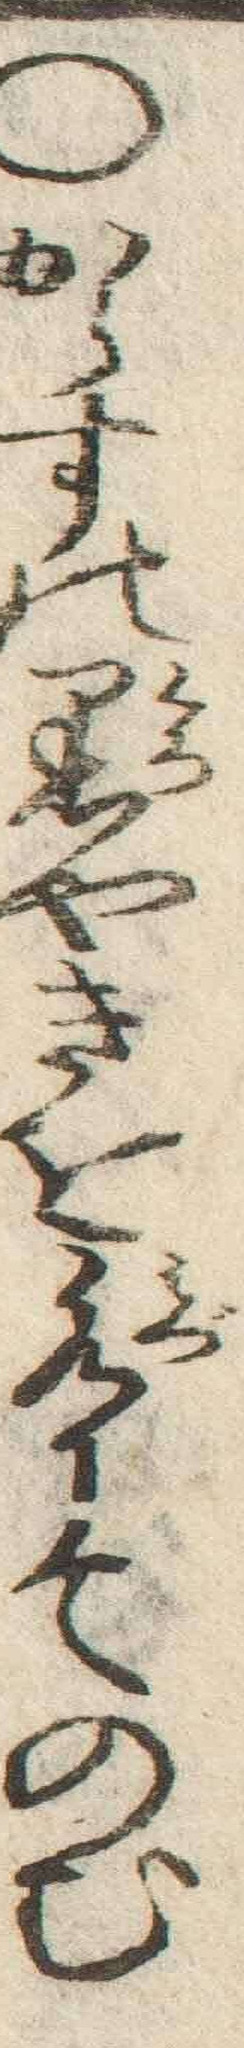○からすの黒やきを水にてのむ
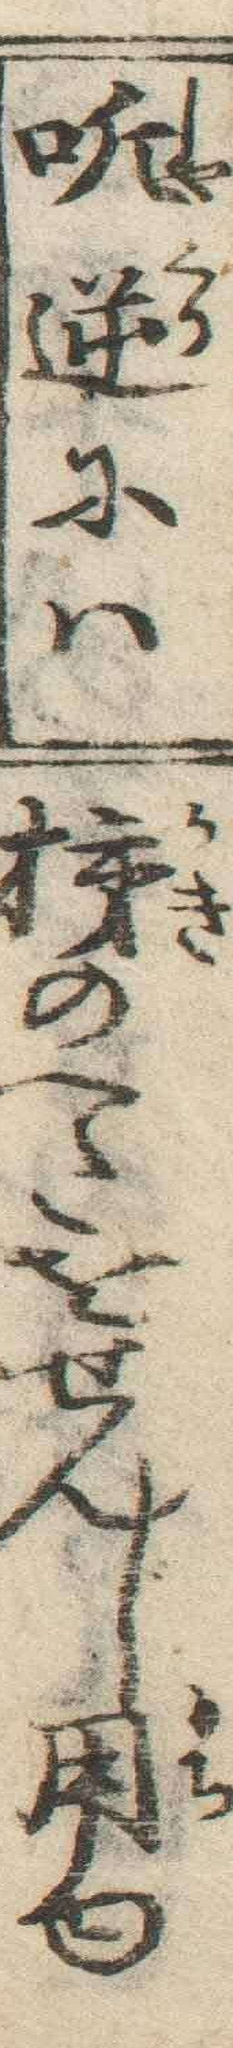听逆には柿のへたをせんじ用ゆ
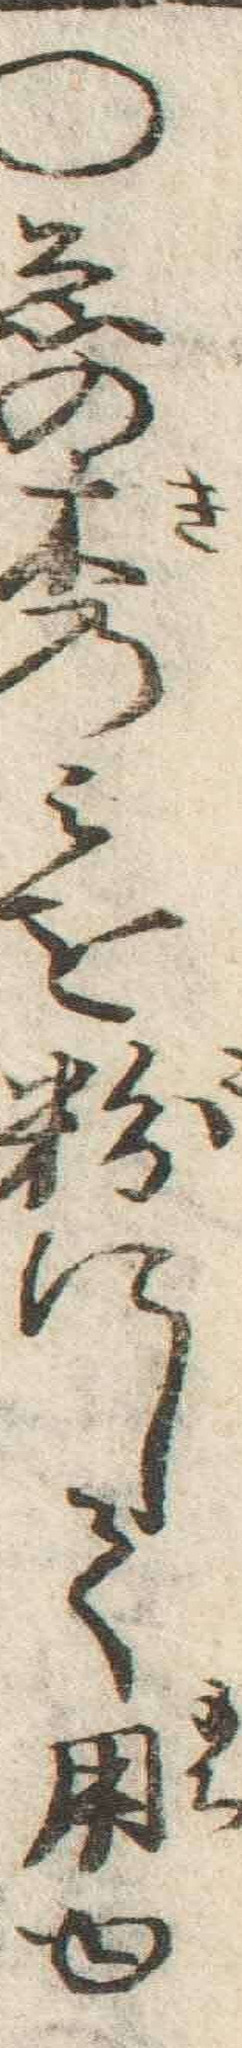○ゑの木のみを粉にして用ゆ
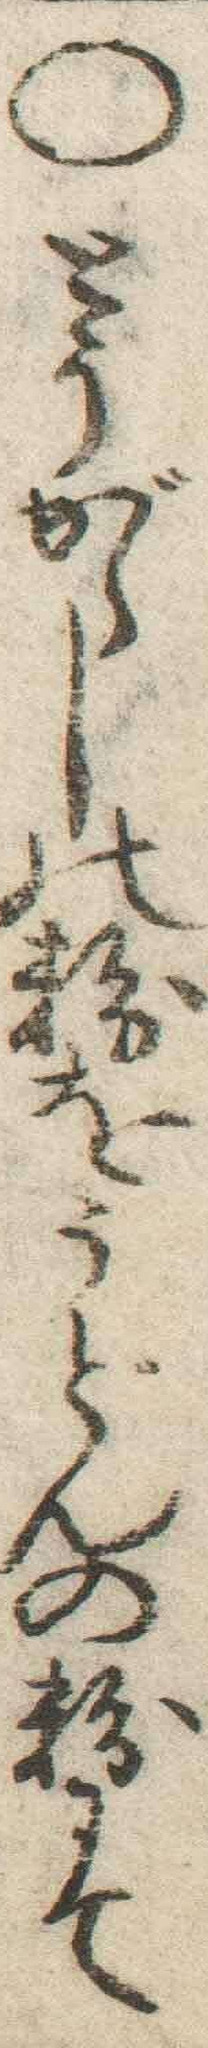○とうがらしの粉をうどんの粉にて
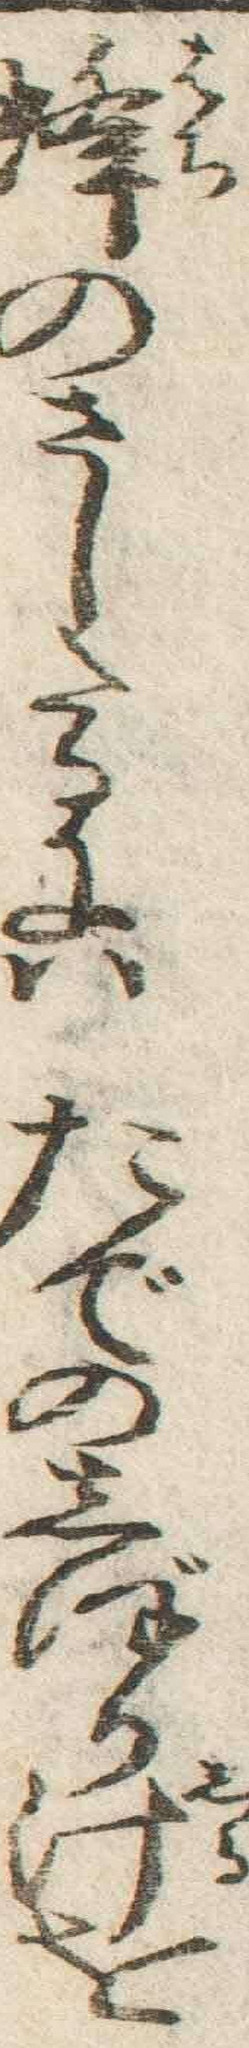蜂のさしたるにはたでのしぼり汁をはち
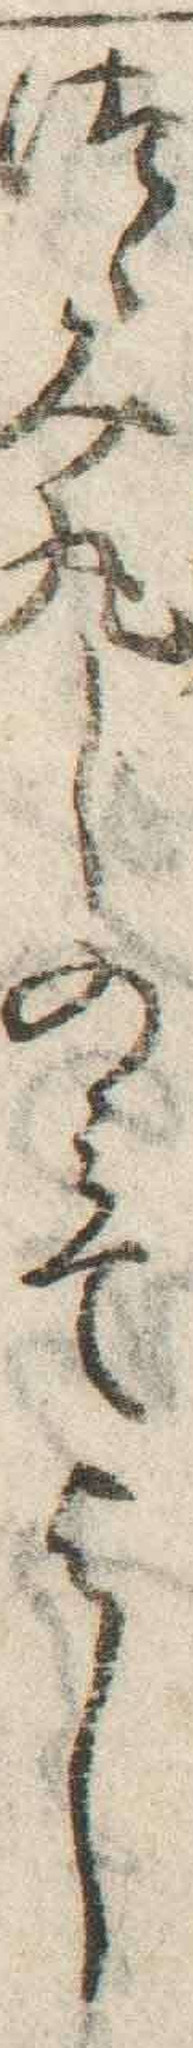つゝみ丸じのみてよし
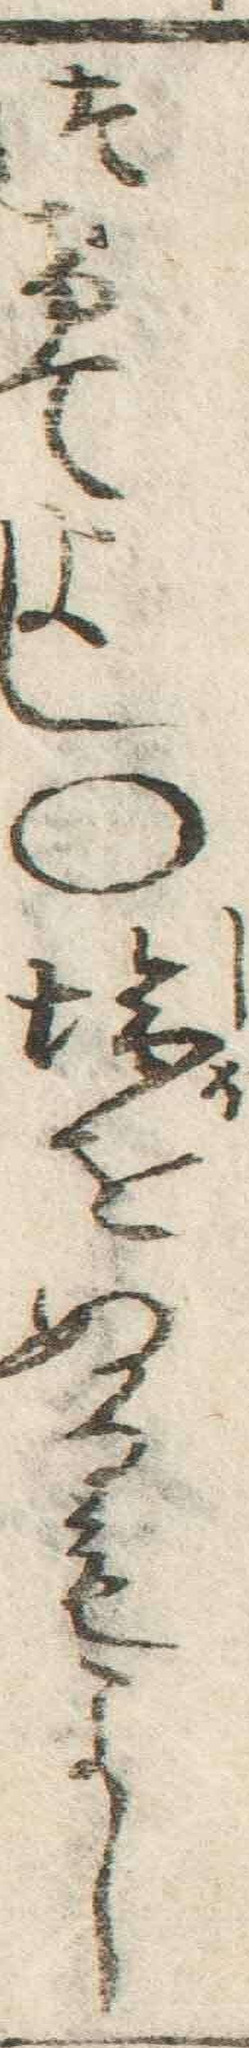つけてよし○塩をぬるもよし
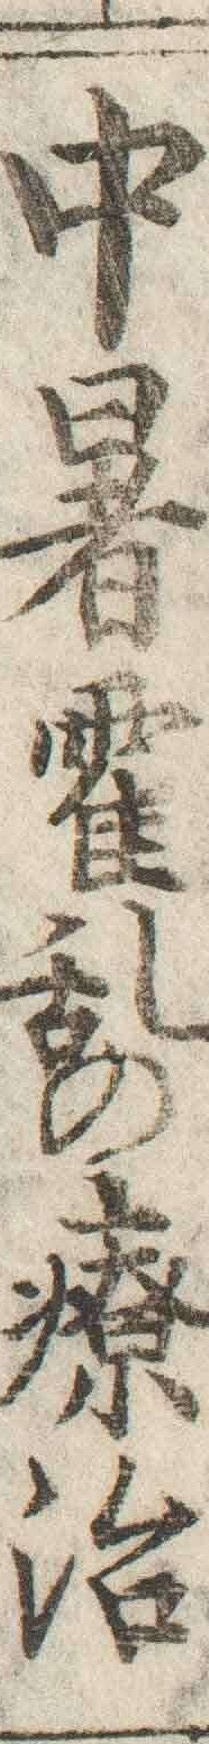中暑霍乱の療治
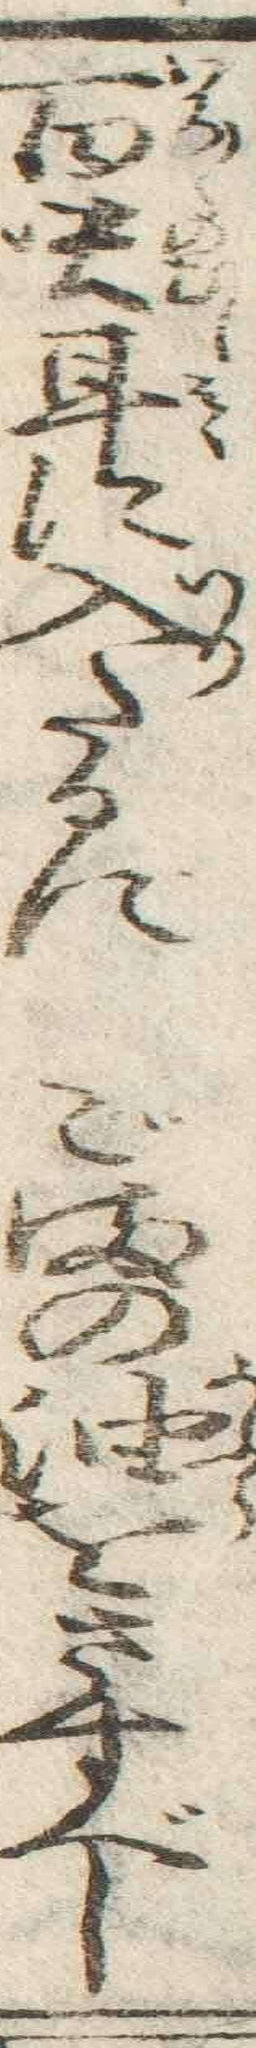百虫耳に入たるにごまの油をさすべし虫
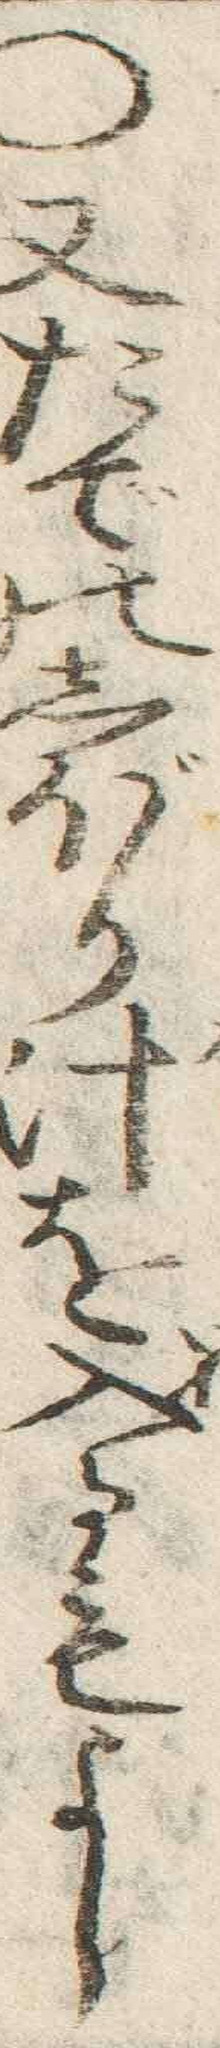○又たでのしぼり汁を入るもよし
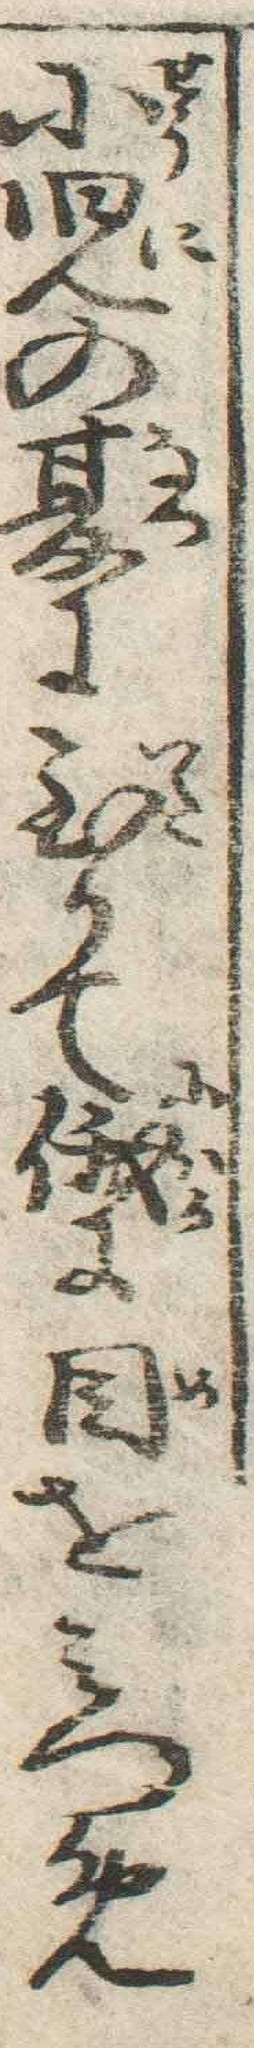小児の夏に至りて俄に目をみつめ
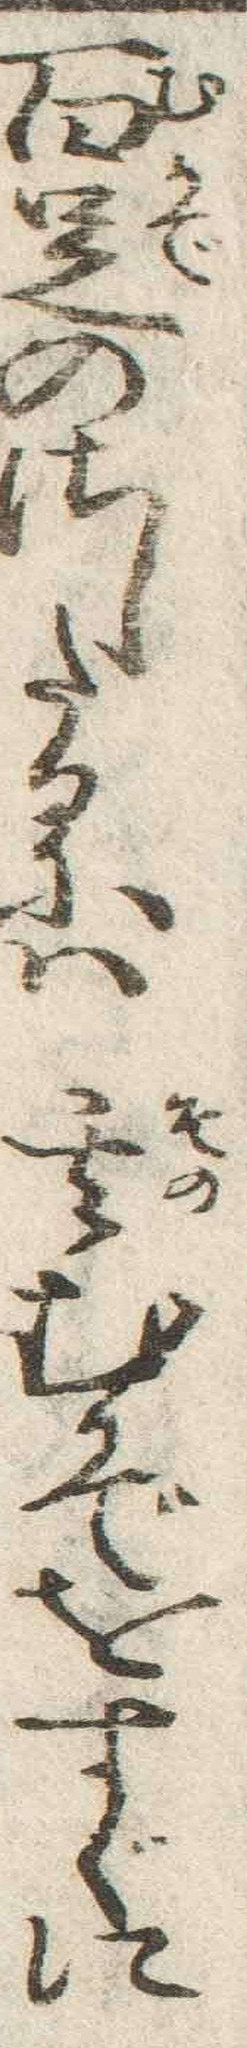百足のさしたるには其むかでをすぐにむかて
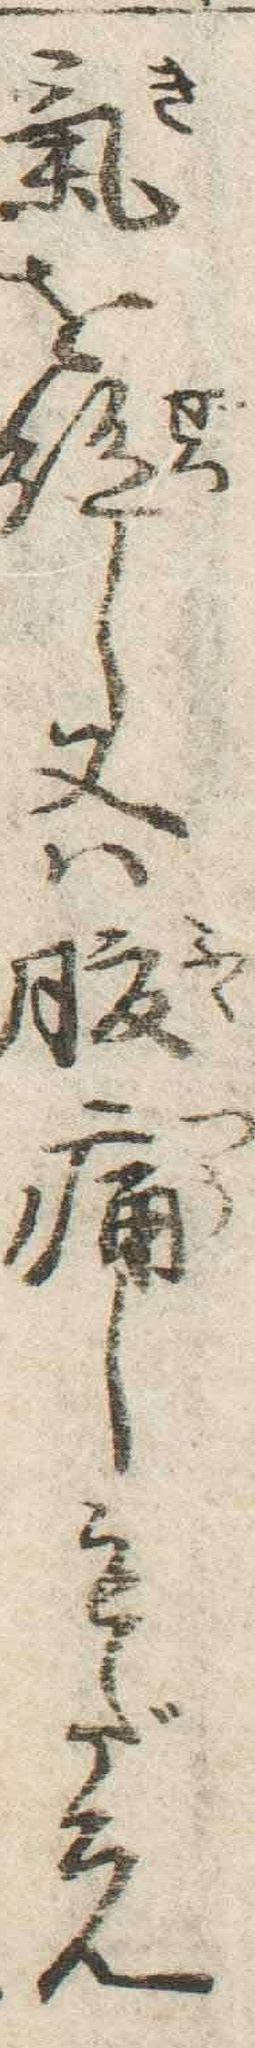気を絶し又は腹痛しもだえ
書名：撫育草
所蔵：東京学芸大学附属図書館 国文学研究資料館
